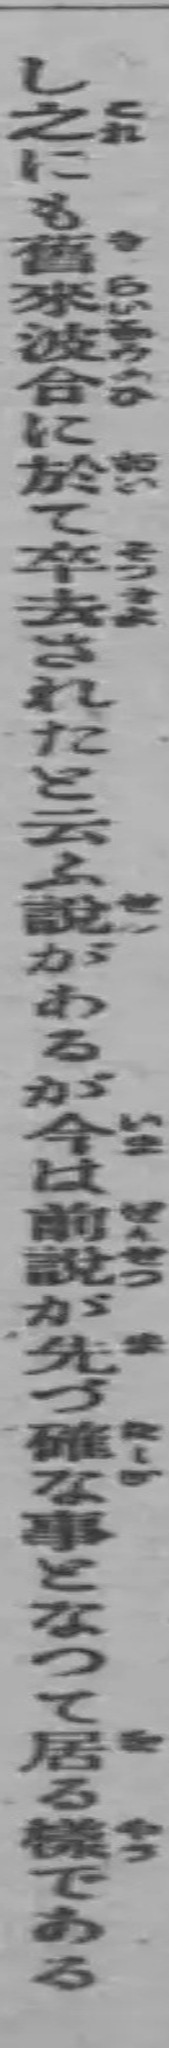し之にも旧来波合に於て卒去されたと云ふ説があるが今は前説が先づ確な事となつて居る様である
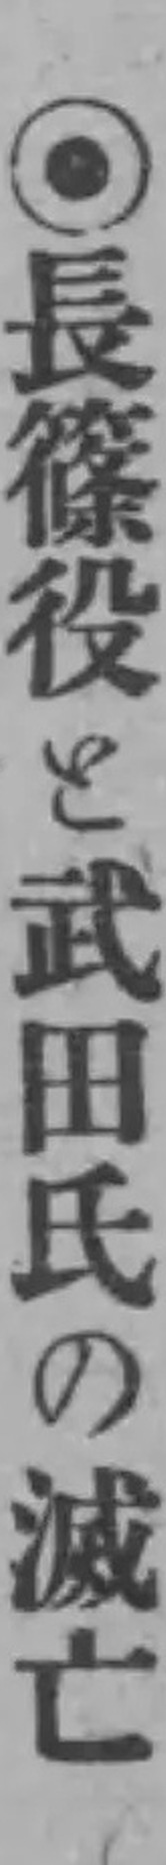◉長篠役と武田氏の滅亡
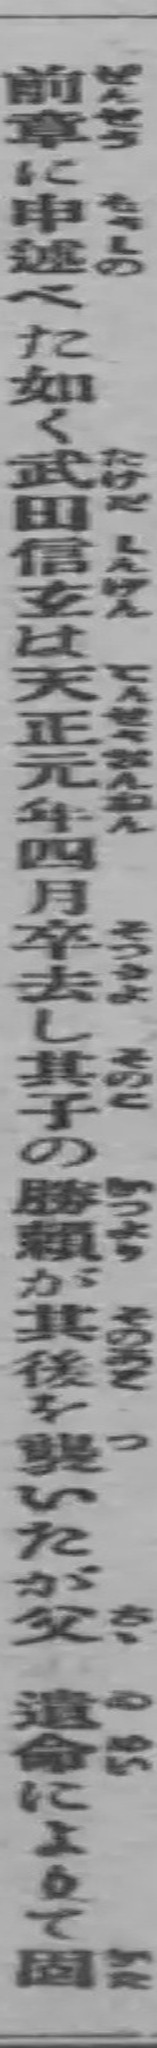前章に申述べた如く武田信玄は天正元年四月卒去し其子の勝頼が其後を襲いたが父の遺命によりて固
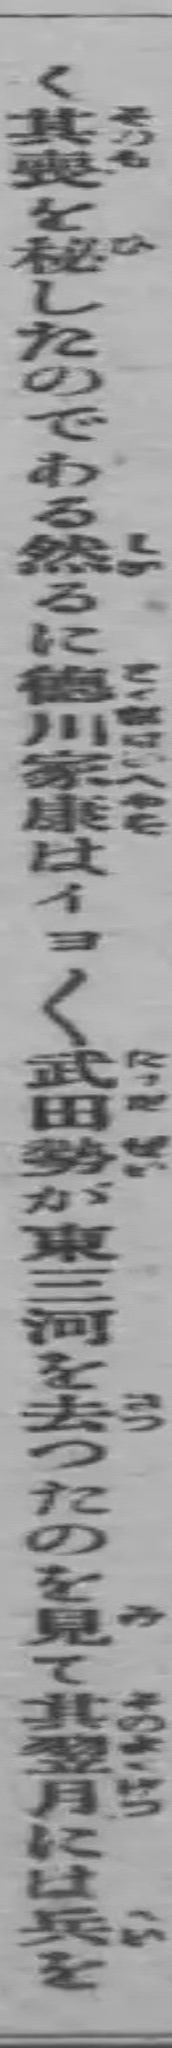く其喪を秘したのである然るに徳川家康はイヨ〳〵武田勢が東三河を去つたのを見て其翌月には兵を
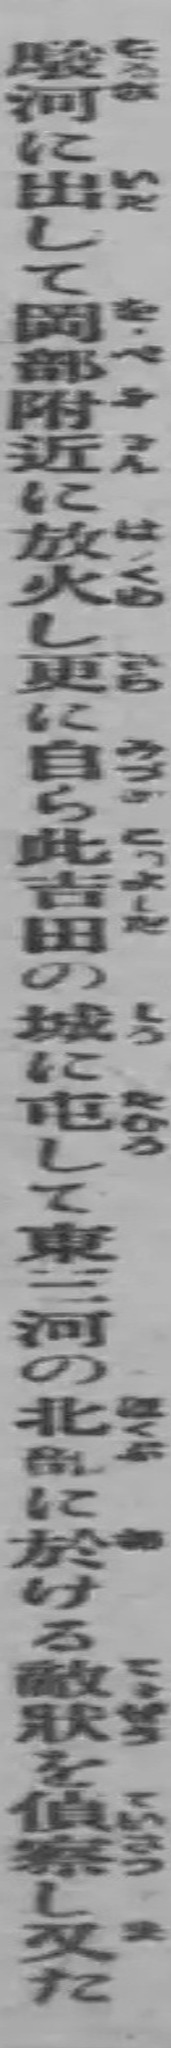駿河に出して岡部附近に放火し更に自ら此吉田の城に屯して東三河の北部に於ける敵状を偵察し又た
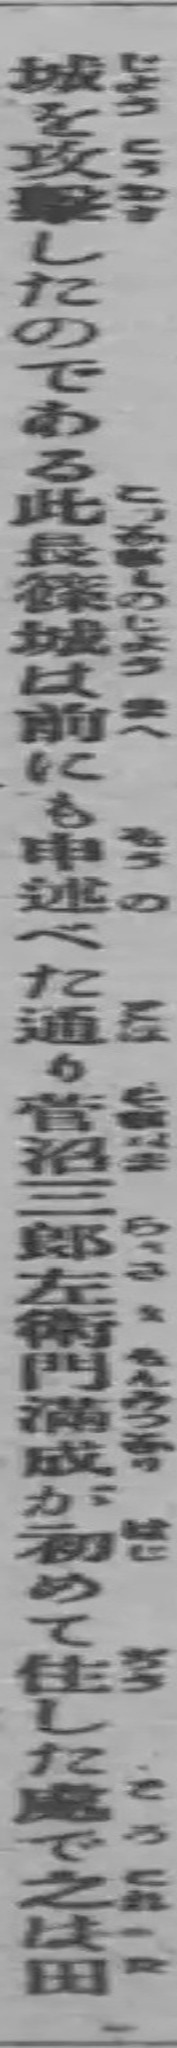城を攻撃したのである此長篠城は前にも申述べた通り菅沼三郎左衛門満成が初めて住した処で之は田
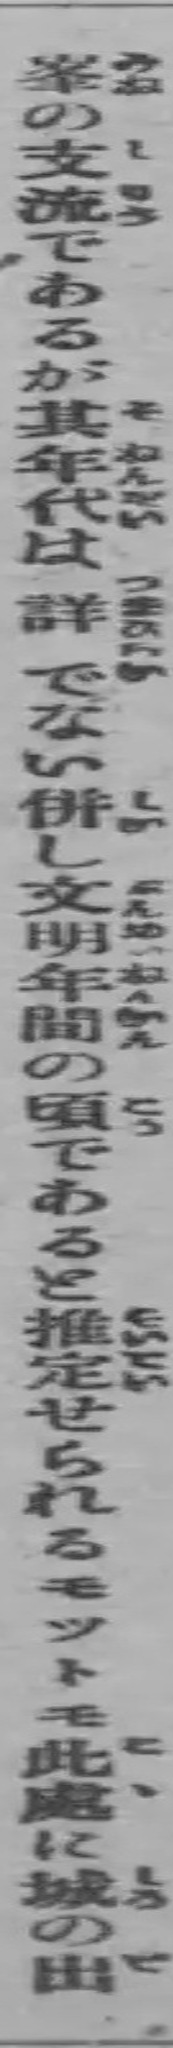峯の支流であるが其年代は詳でない併し文明年間の頃であると推定せられるモツトモ此処に城の出
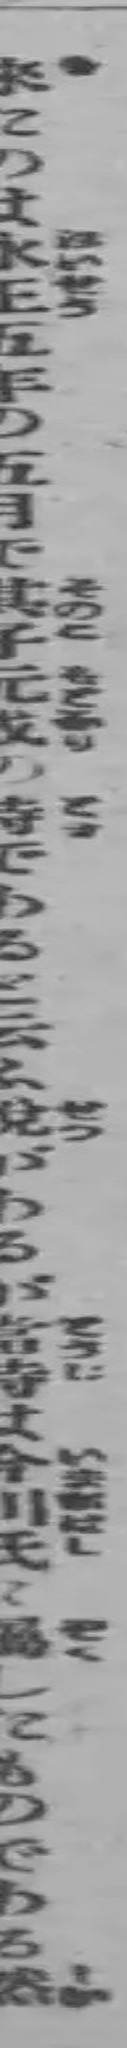来たのは永正五年の五月で其子元成の時であると云ふ説があるが当時は今川氏に属したものである然
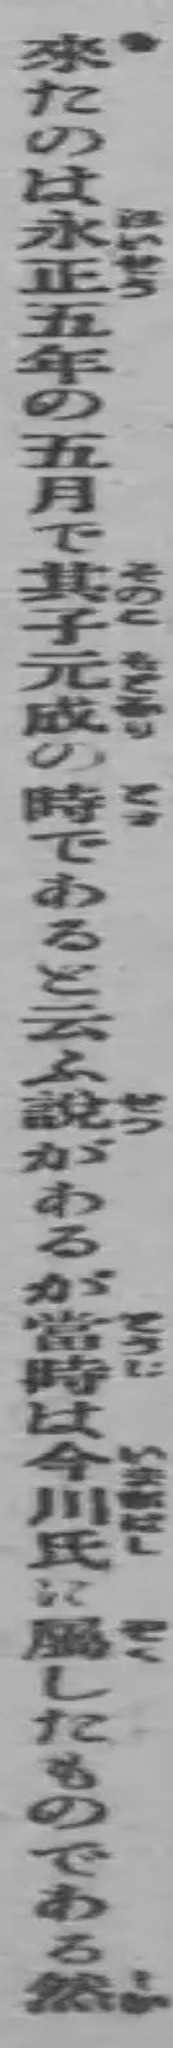来たのは永正五年の五月で其子元成の時であると云ふ説があるが当時は今川氏に属したものである然
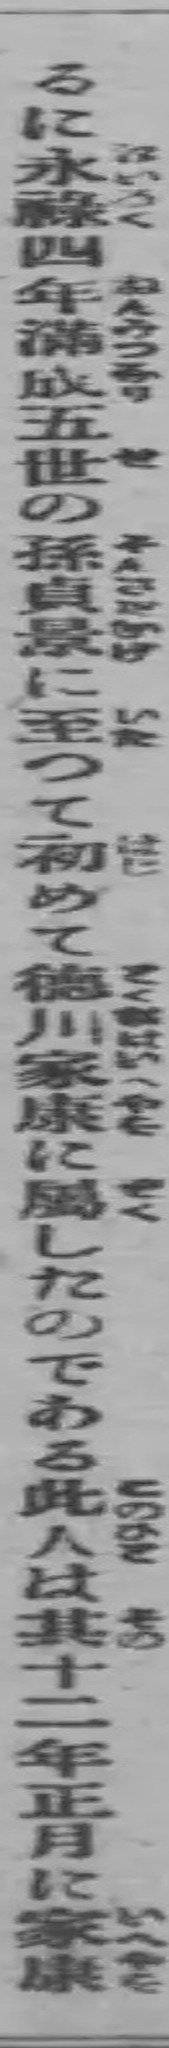るに永禄四年満成五世の孫貞景に至つて初めて徳川家康に属したのである此人は其十二年正月に家康
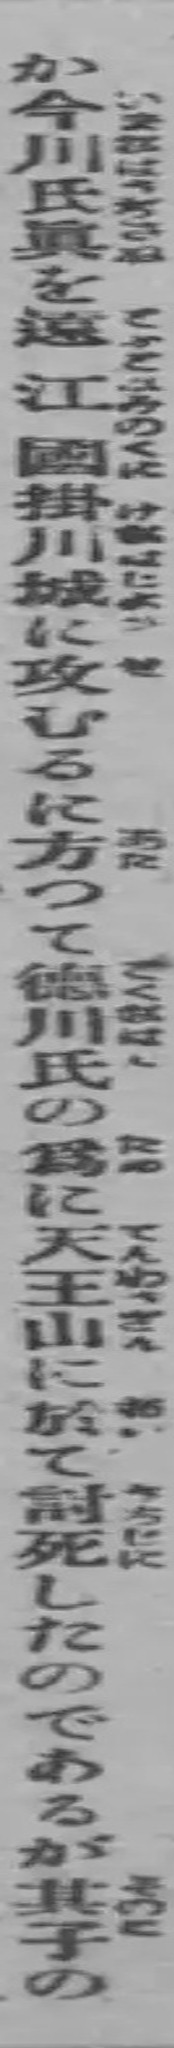か今川氏真を遠江国掛川城に攻むるに方つて徳川氏の為に天王山に於て討死したのであるが其子の
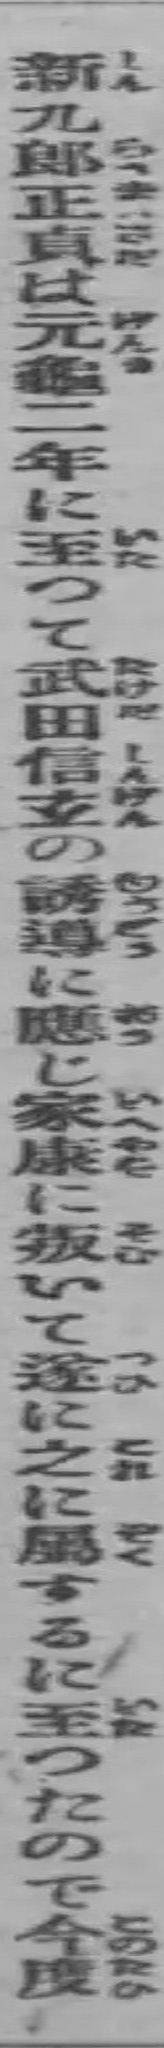新九郎正貞は元亀二年に至つて武田信玄の誘導に応じ家康に叛いて遂に之に属するに至つたので今度
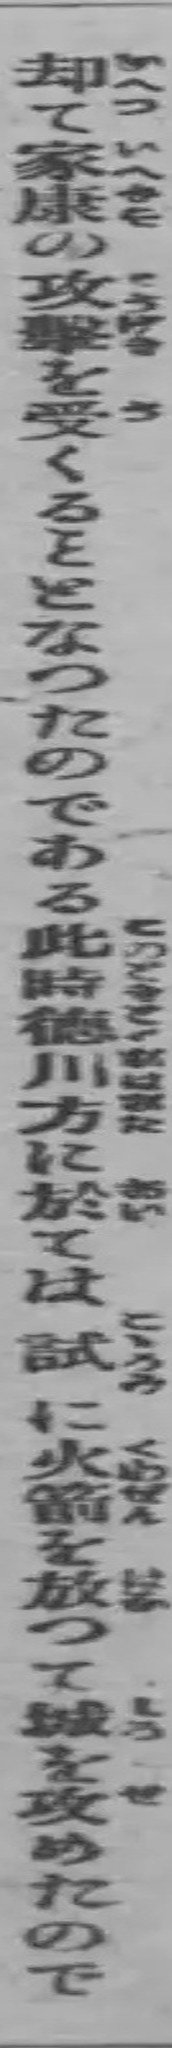却て家康の攻撃を受くることとなつたのである此時徳川方に於ては試に火箭を放つて城を攻めたので
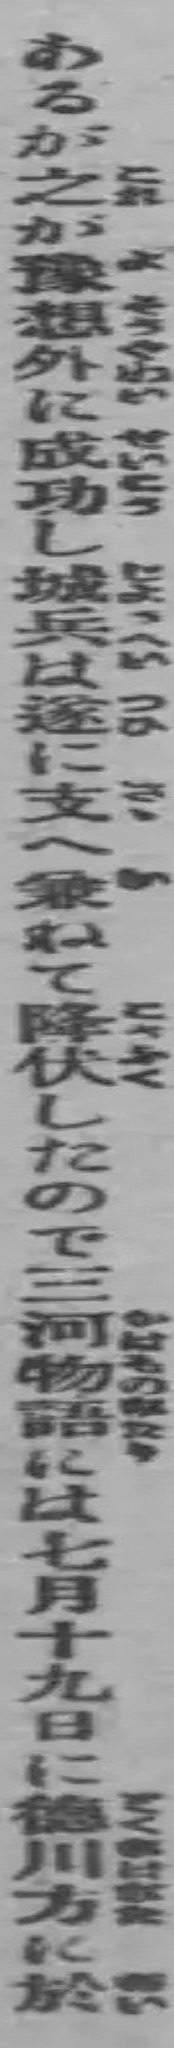あるが之が予想外に成功し城兵は遂に支へ兼ねて降伏したので三河物語には七月十九日に徳川方に於
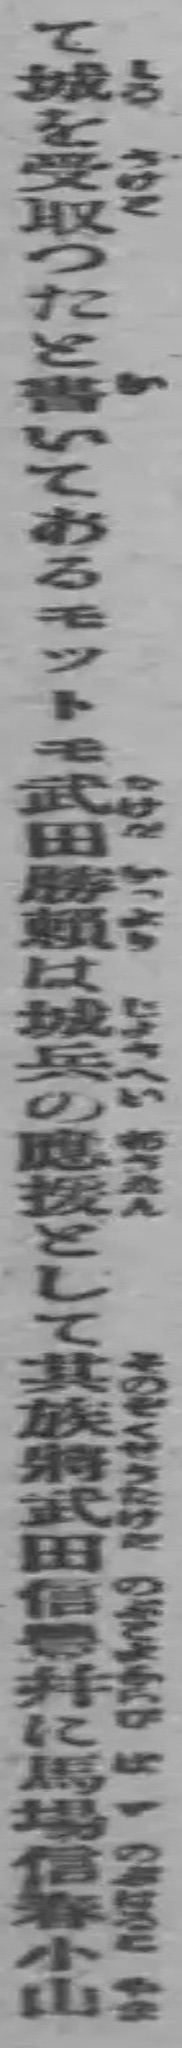て城を受取つたと書いてあるモツトモ武田勝頼は城兵の応援として其族将武田信豊幷に馬場信春小山

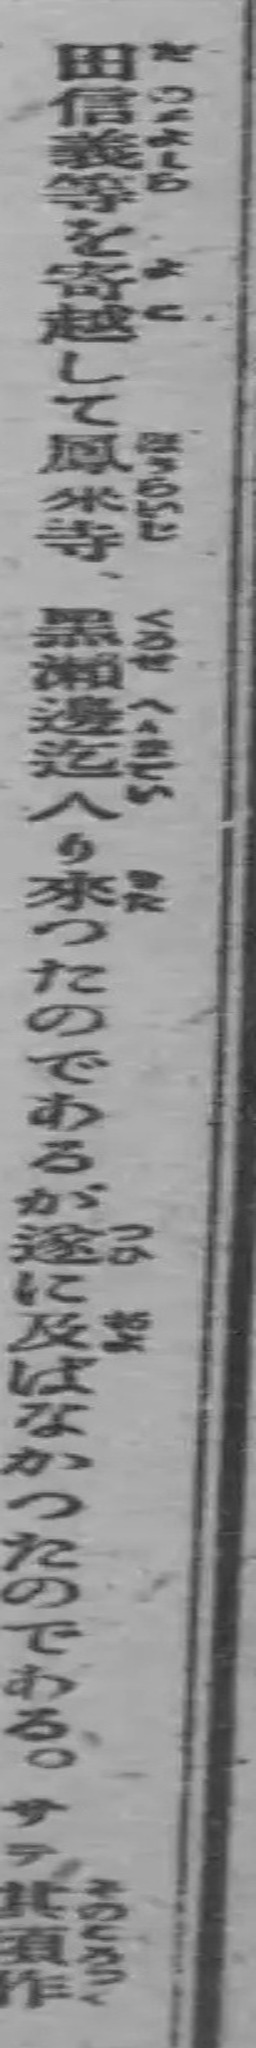田信義等を寄越して鳳来寺の黒瀬辺迄入り来つたのであるが遂に及ばなかつたのである。サテ其頃作
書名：豊橋市史談
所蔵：国立国会図書館 National Diet Library, JAPAN
